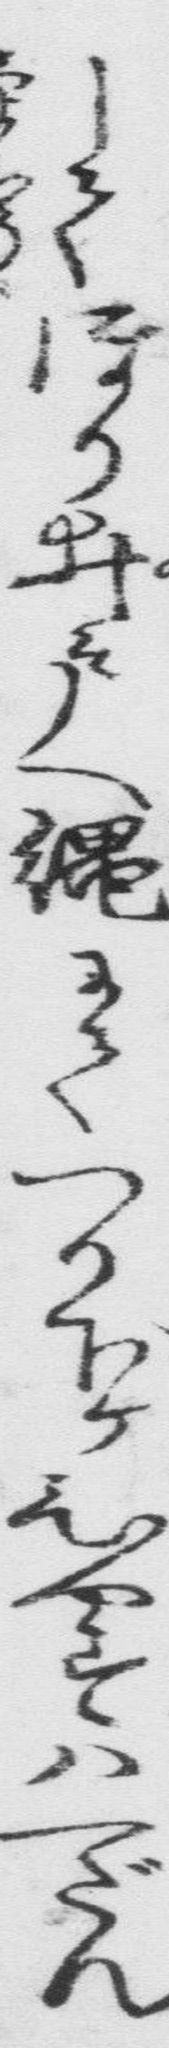してほり井戸へ縄にてつり下けひやすは一だん
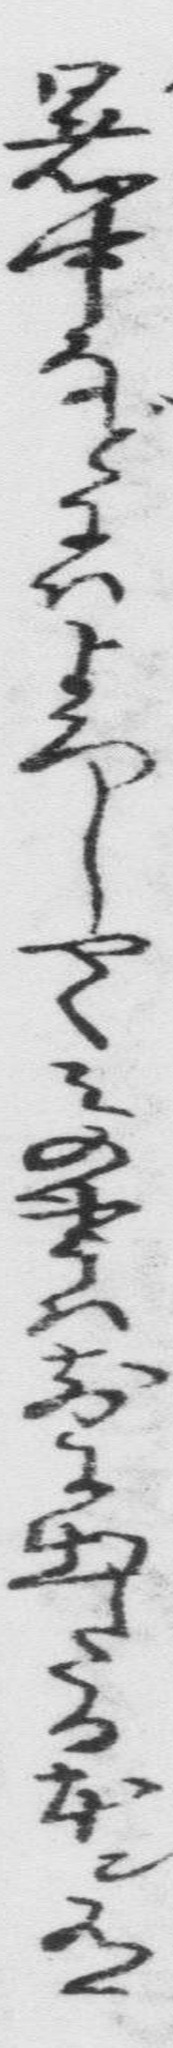暑中などにはよろしやくみの事は前に出したる本に有
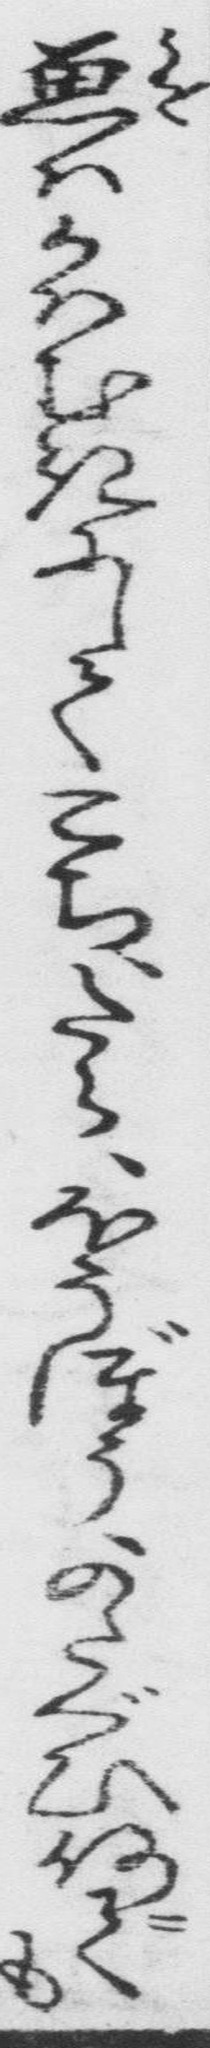魚はかはむきにしてこち、たら、ほうぼう、のたぐひ何にても
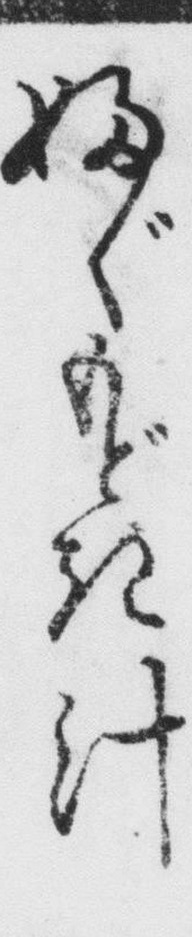ふぐもどき汁
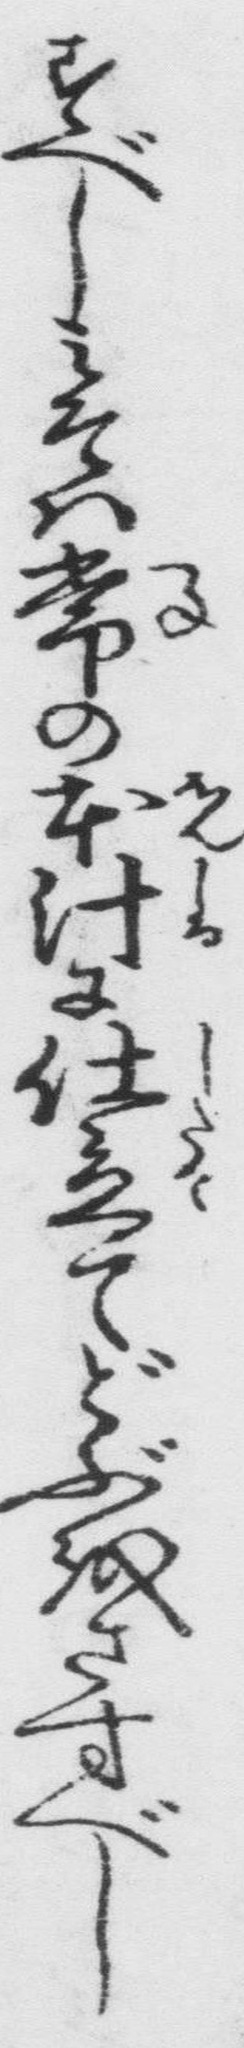すべしみそは常の本汁に仕立てどぶをさすべし
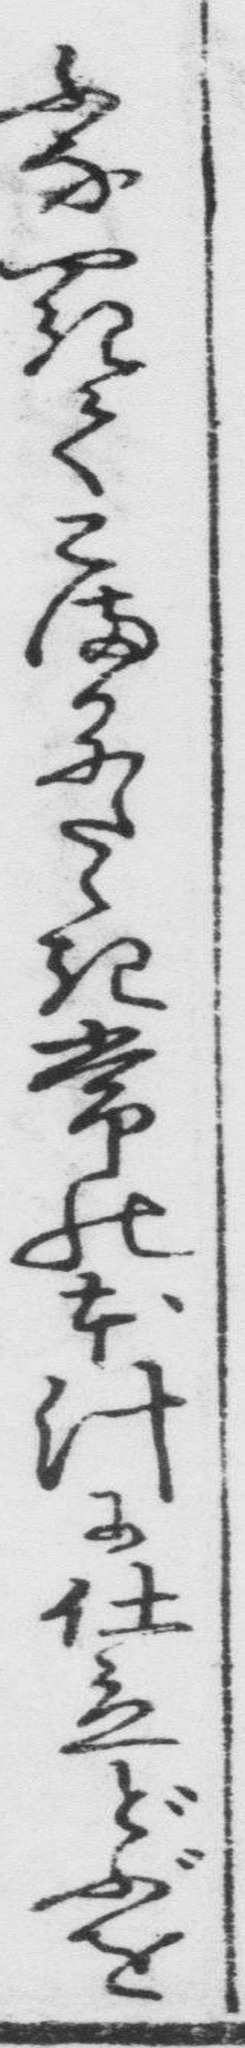うなやきてこまかにたゝき常の本汁に仕立どぶを
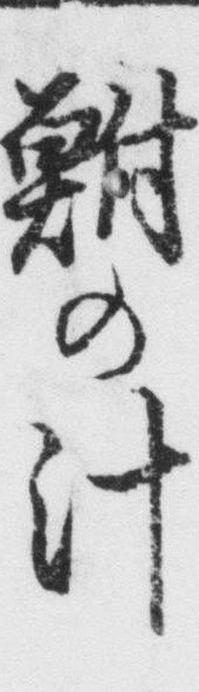鮒の汁
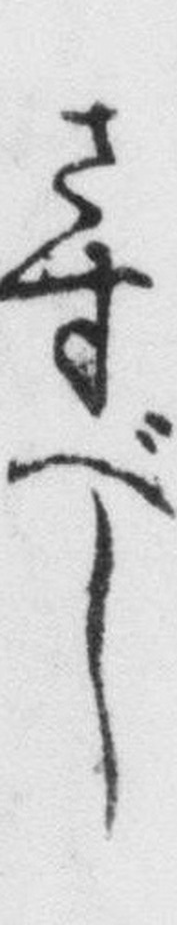さすべし
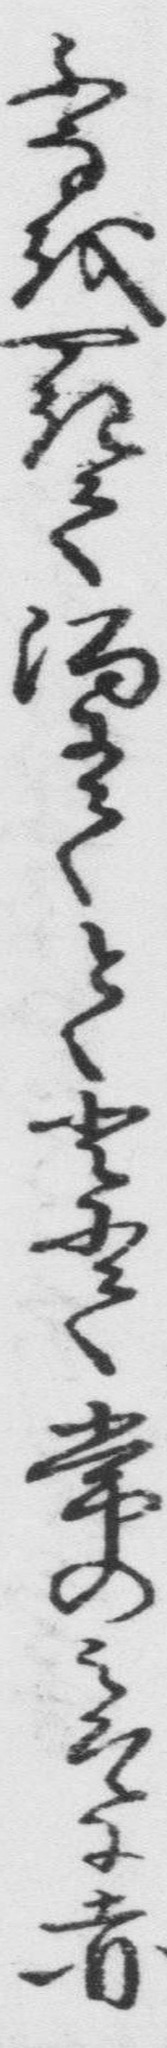ふなをやきて酒にてとくとにて常のみそに赤
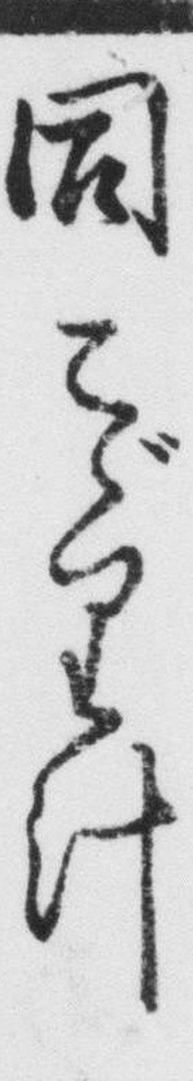同こゞり汁
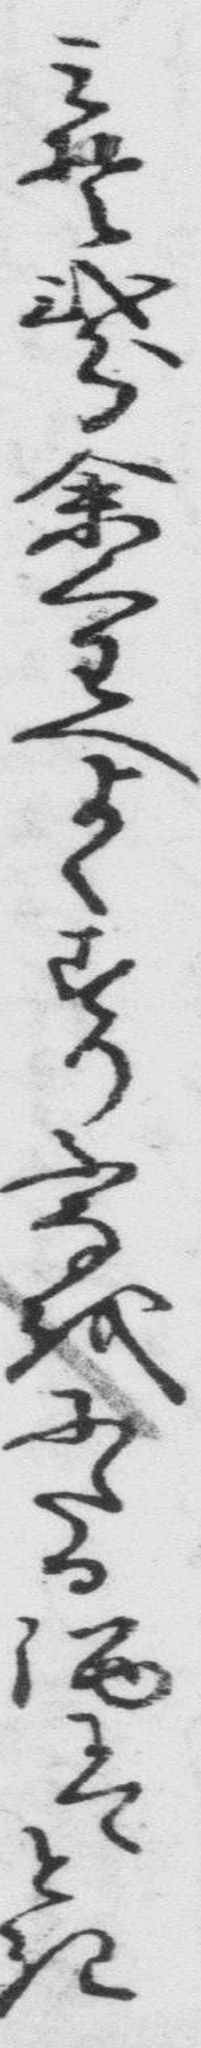みそ弐分余くわへよくすりふなをにたる酒にてとき
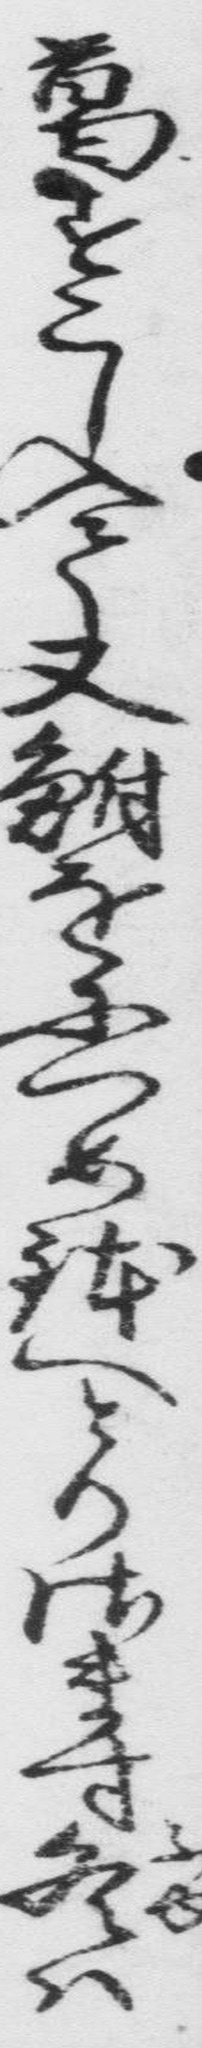葛すこし入れて又鮒をにつめ鉢へとりさます冬は
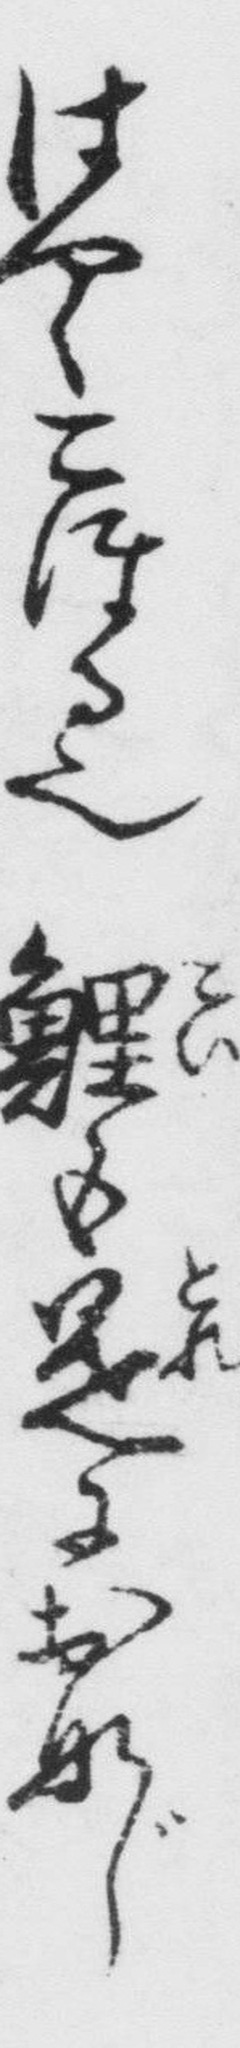はやくこほる也鯉も是におなじ
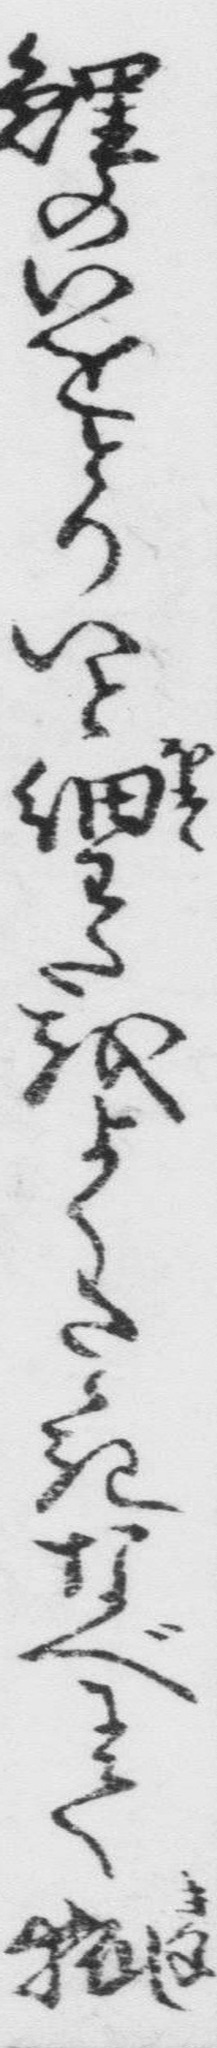鯉のいをとりいと細わたをよくたゝきなべにて狐
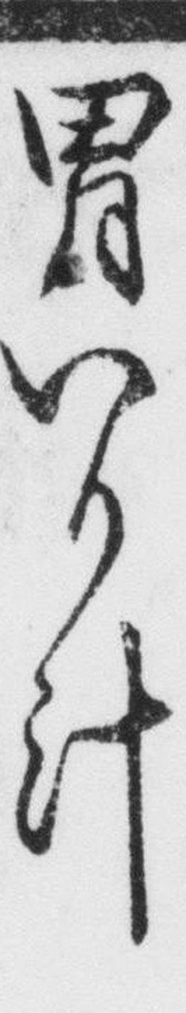胃いり汁
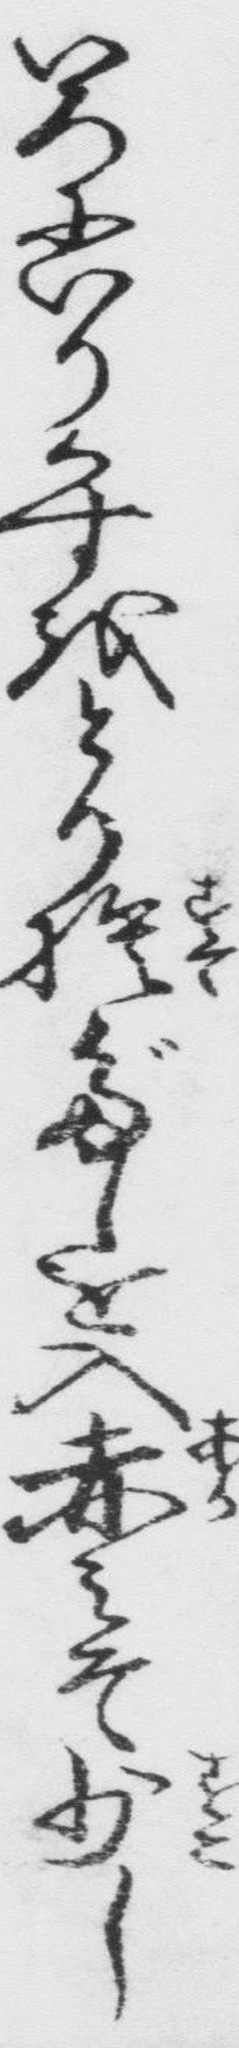いろにいりかすをとり捨だしを入赤みそ少し
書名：料理早指南
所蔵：大阪府立大学学術情報センター 国文学研究資料館
